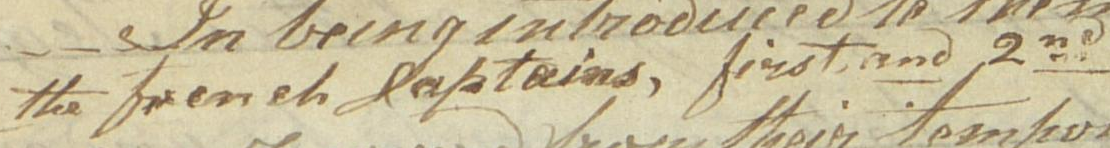the french Captains, first and 2^nd
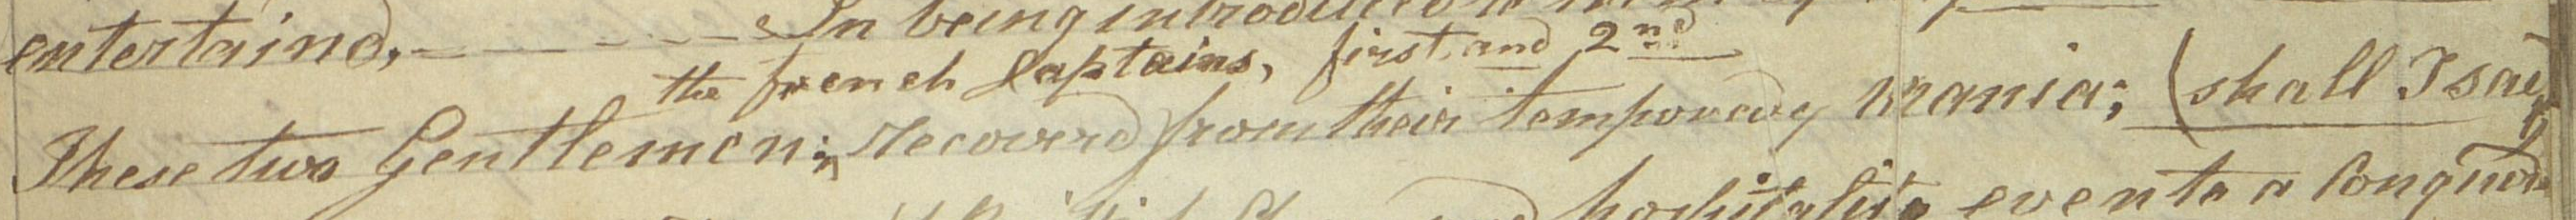These two Gentlemen; ^ recoverd from their tempovedy Mania; (shall I say
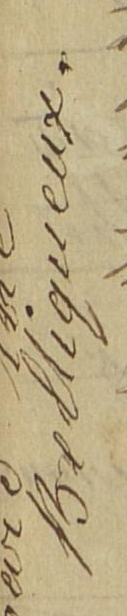Belliqueux.
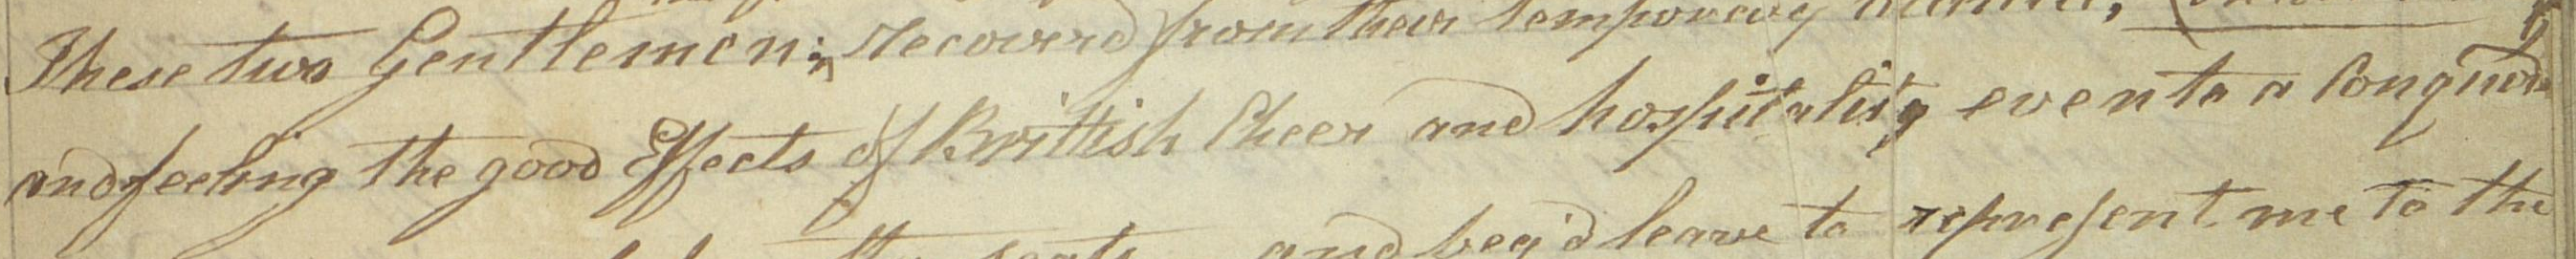and feeling the good Effects of Brittish Cheer and hospitality even to a Conquerd
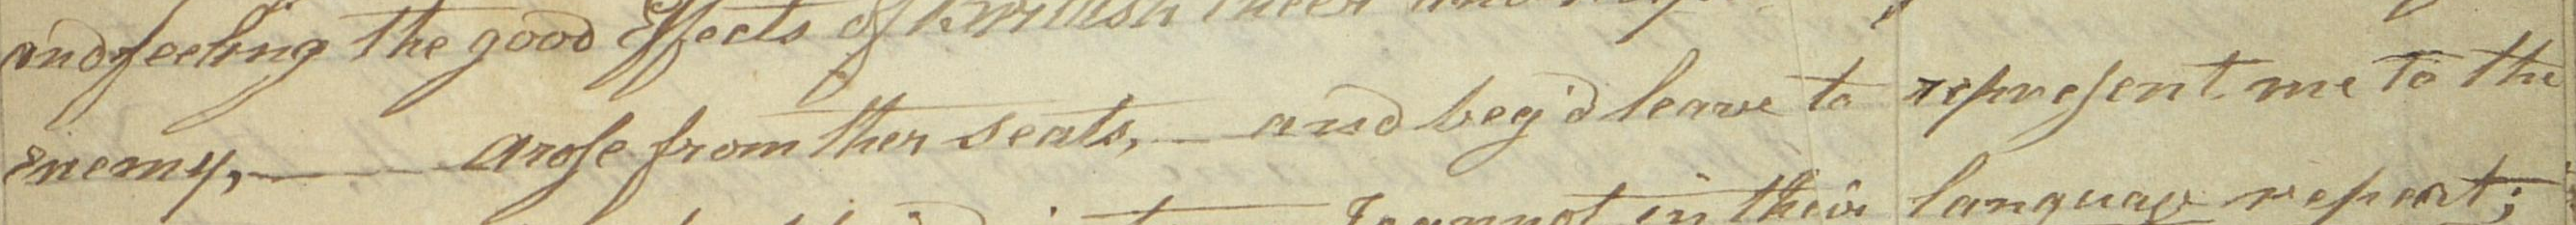enemy Arose from ther seats, and beg'd learn to represent me to the
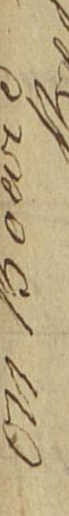On Board
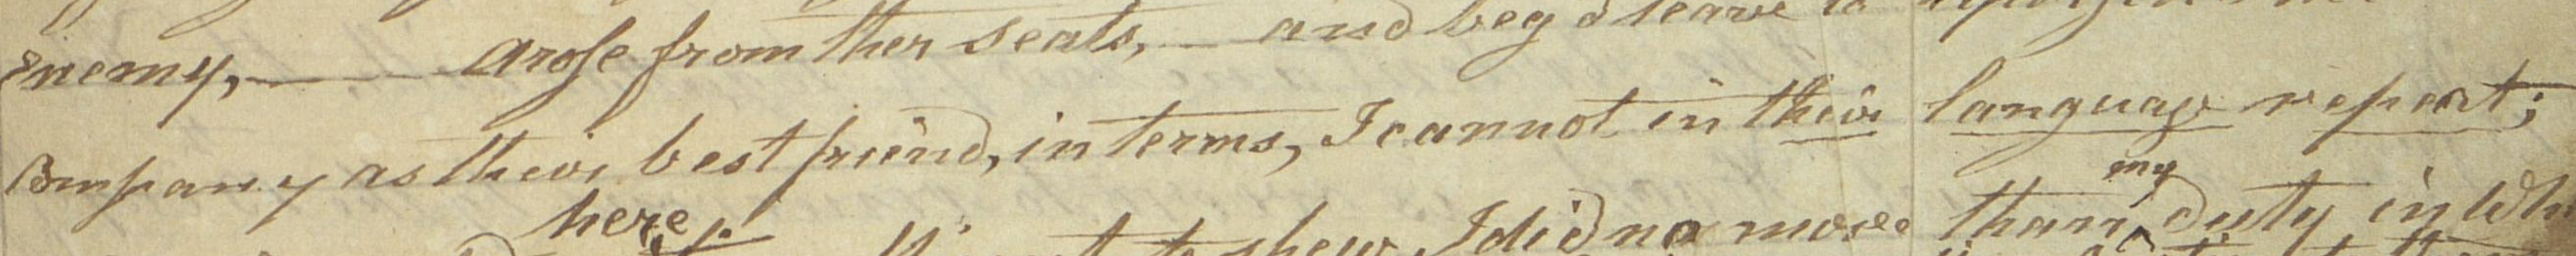Company as their best friend in terms, I cannot in their language repent,
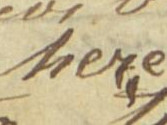here
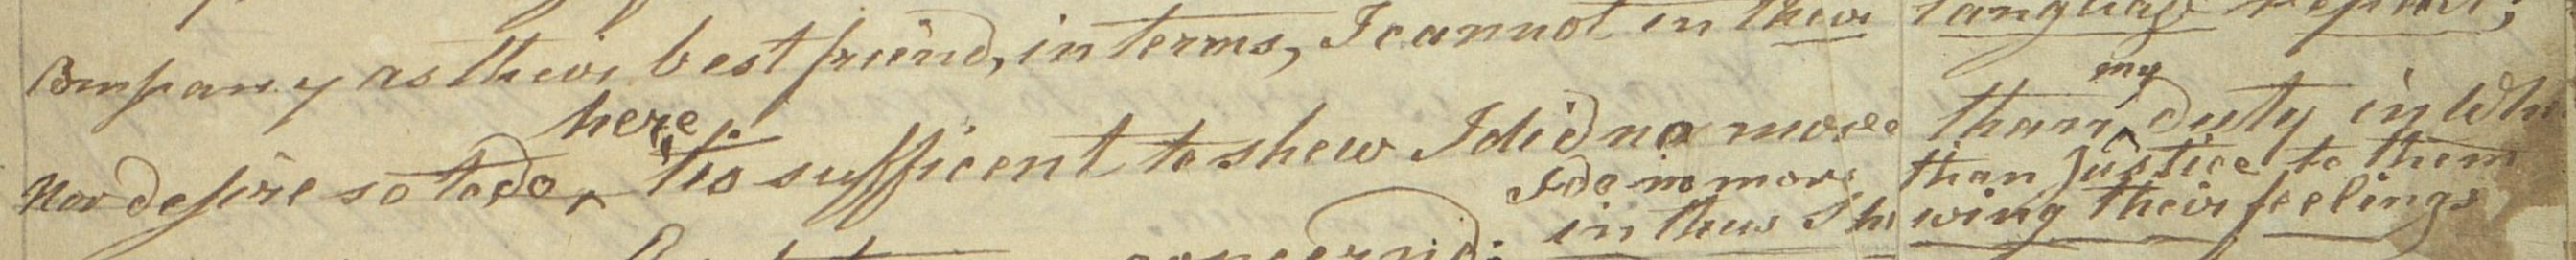Nor desire so to do ^ Tis sufficent to shew I did no more than ^ duty in Wh-
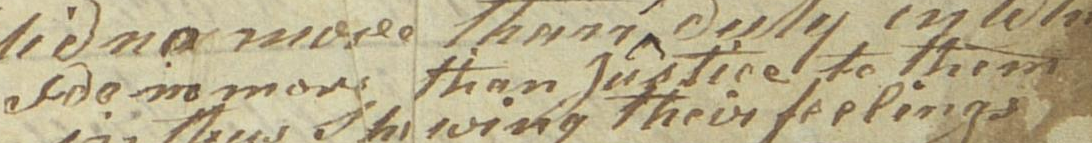I do no more than Justice to them
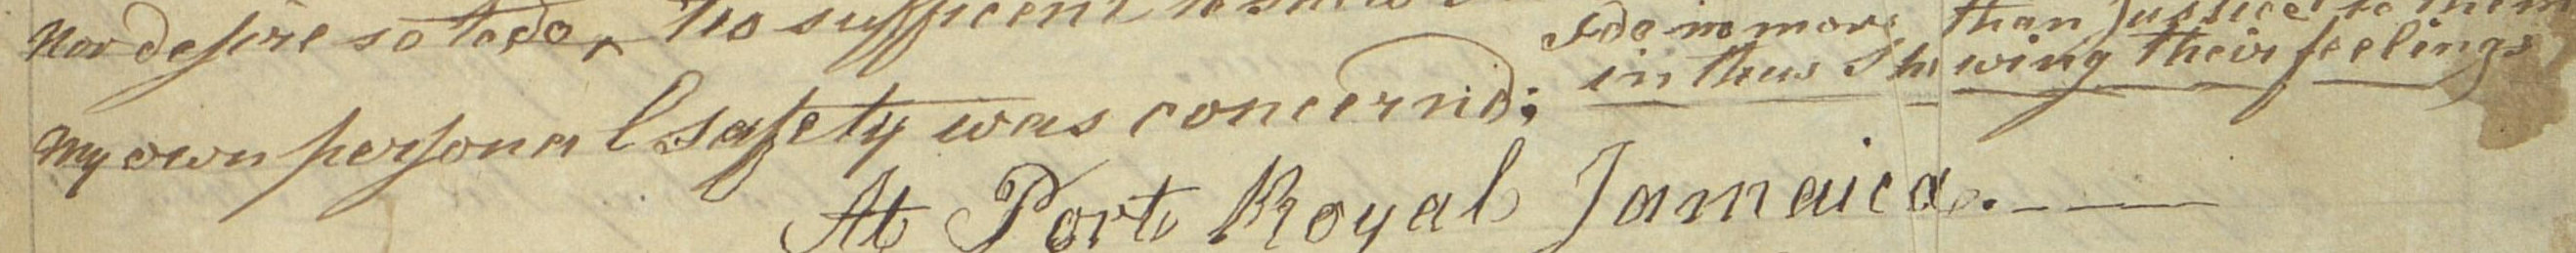My own personal safety was concernd; in thus Sh- -wing their feelings
